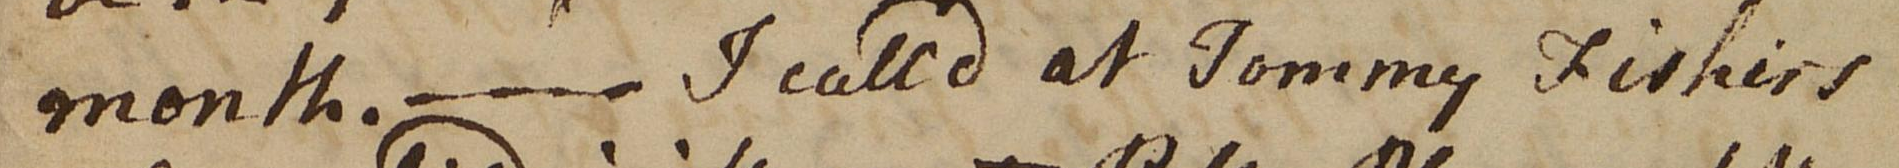month.- I calld at Tommy Fishers
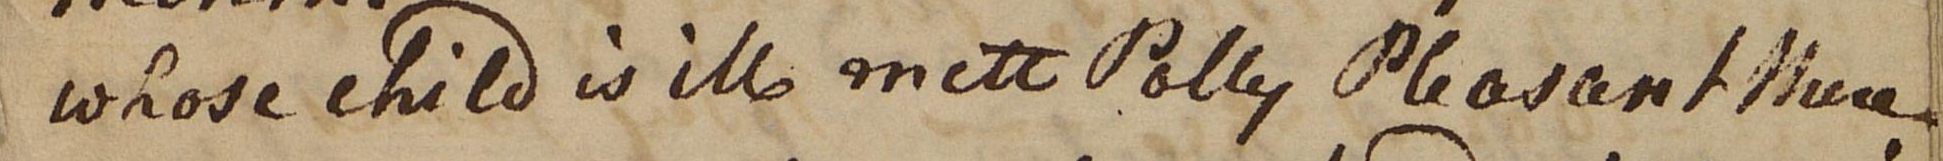whose child is ill mett Polly Pleasant there
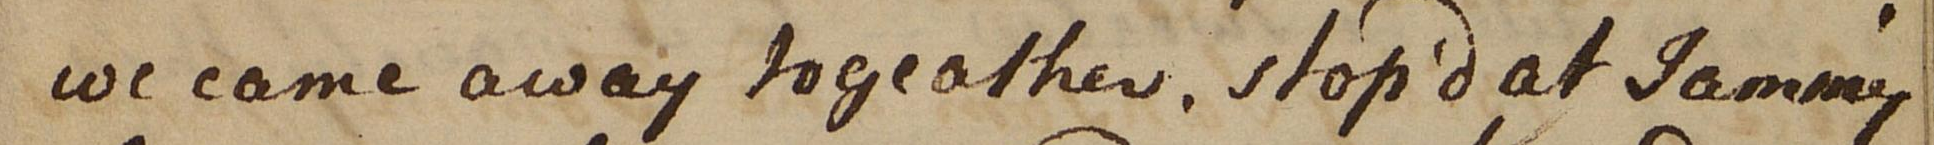we came away togeather, stop'd at Tammy
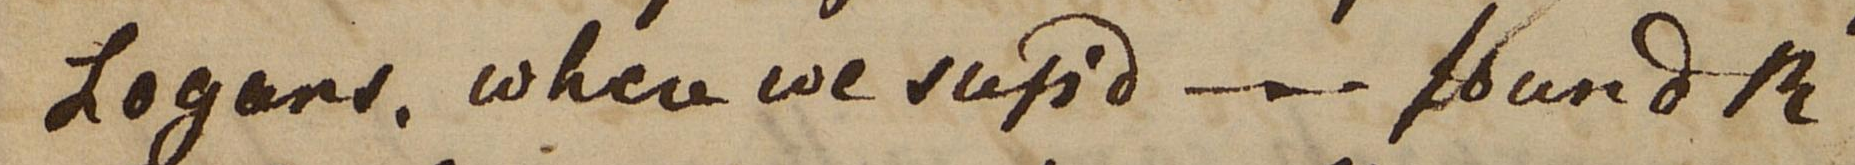Logans, where we sup'd- found [R]
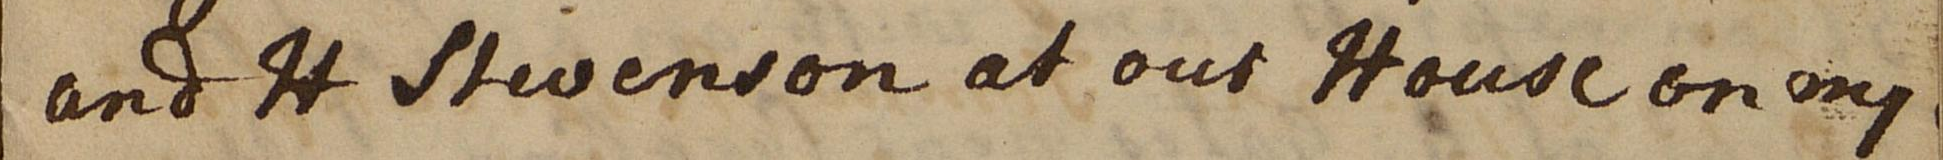and H Stevenson at our House on my
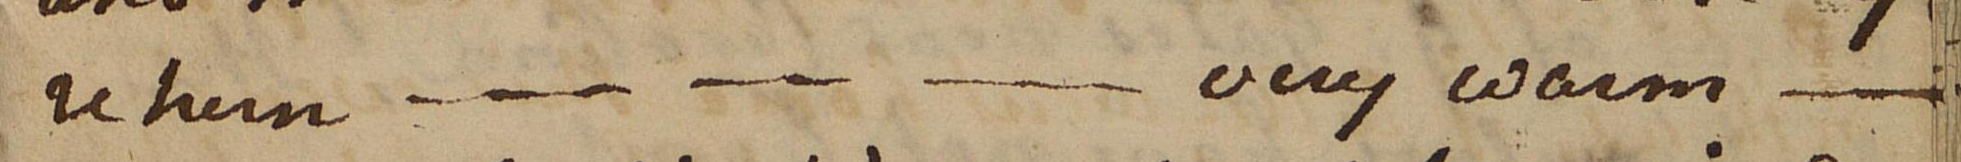return---- very warm-
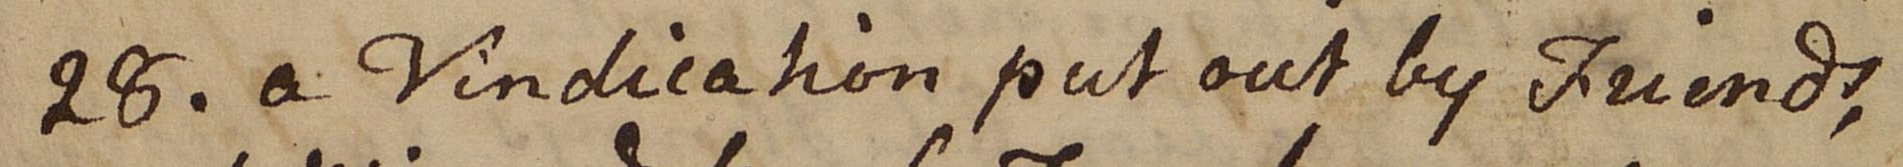28. a Vindication put out by Friends,
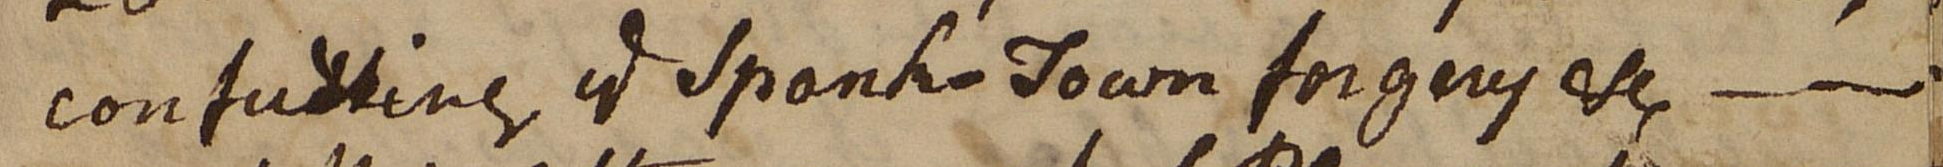con[sul]ting y^e Spank-Town forgery &c-
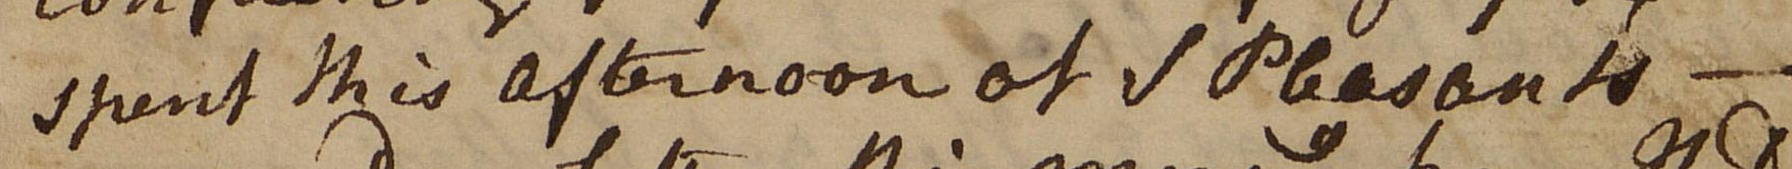spent this afternoon of S Pleasants-
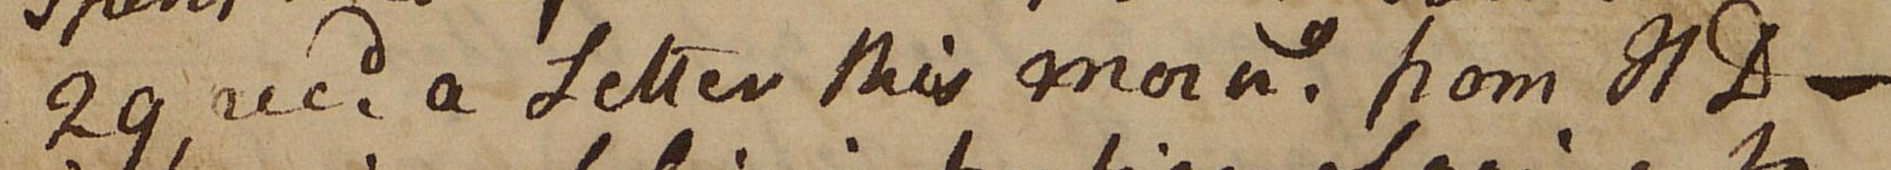29 rec^d a Letter this morn^g. from HD-
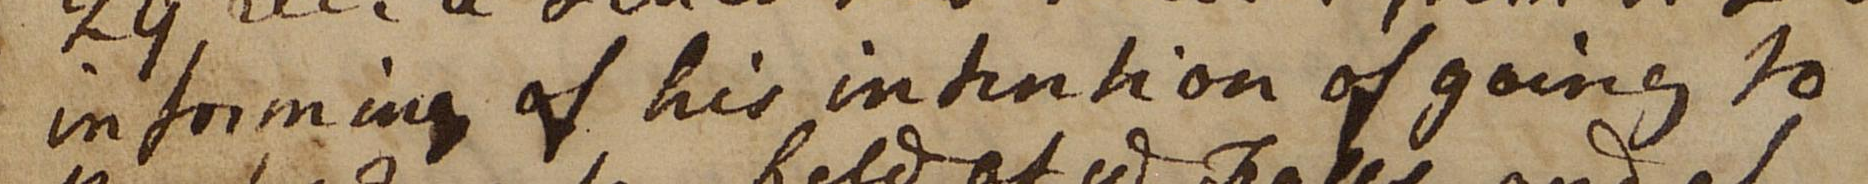informing of his intention of going to
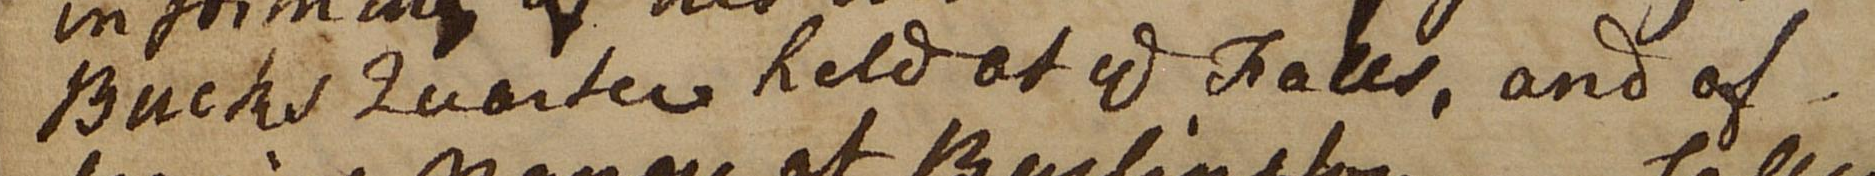Bucks Quarter held at y^e Falls, and of
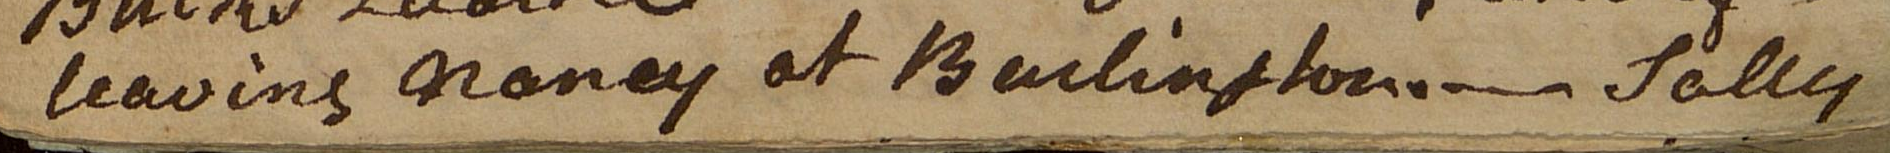leaving Nancy at Burlington- Sally
